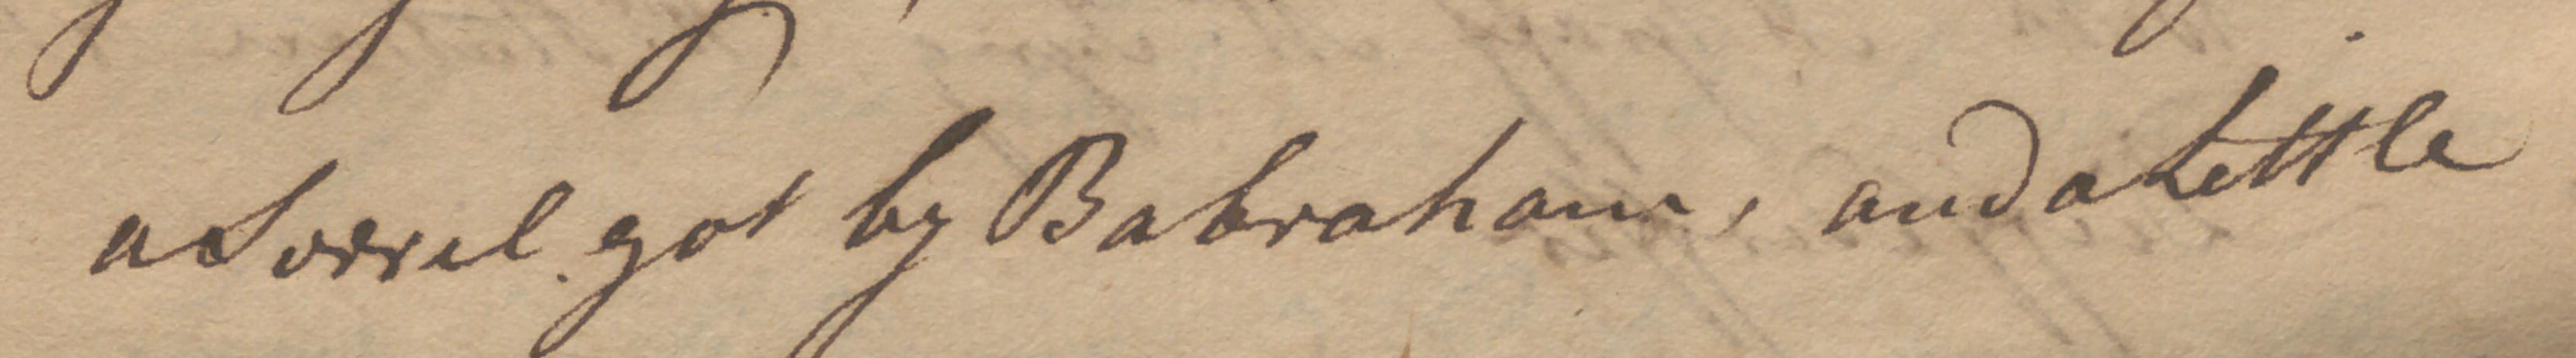a Sorrel got by Babraham, and a Little
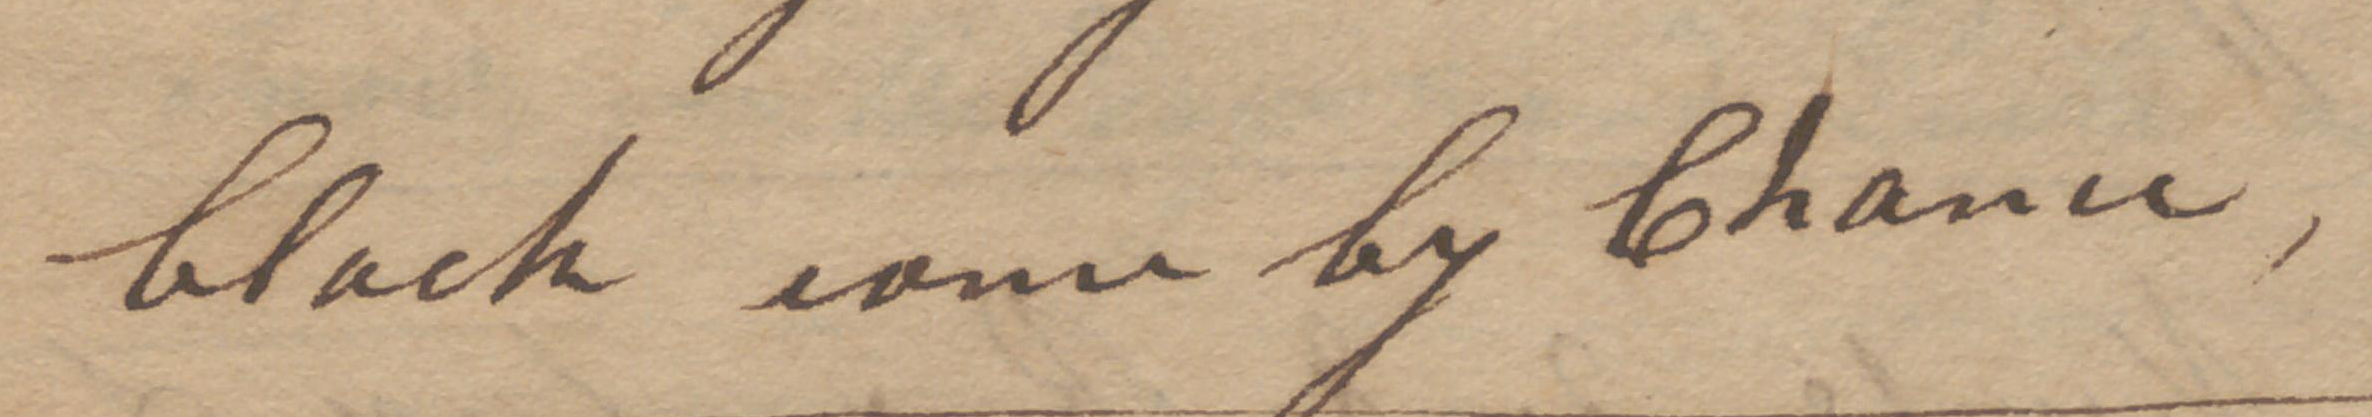black come by Chance
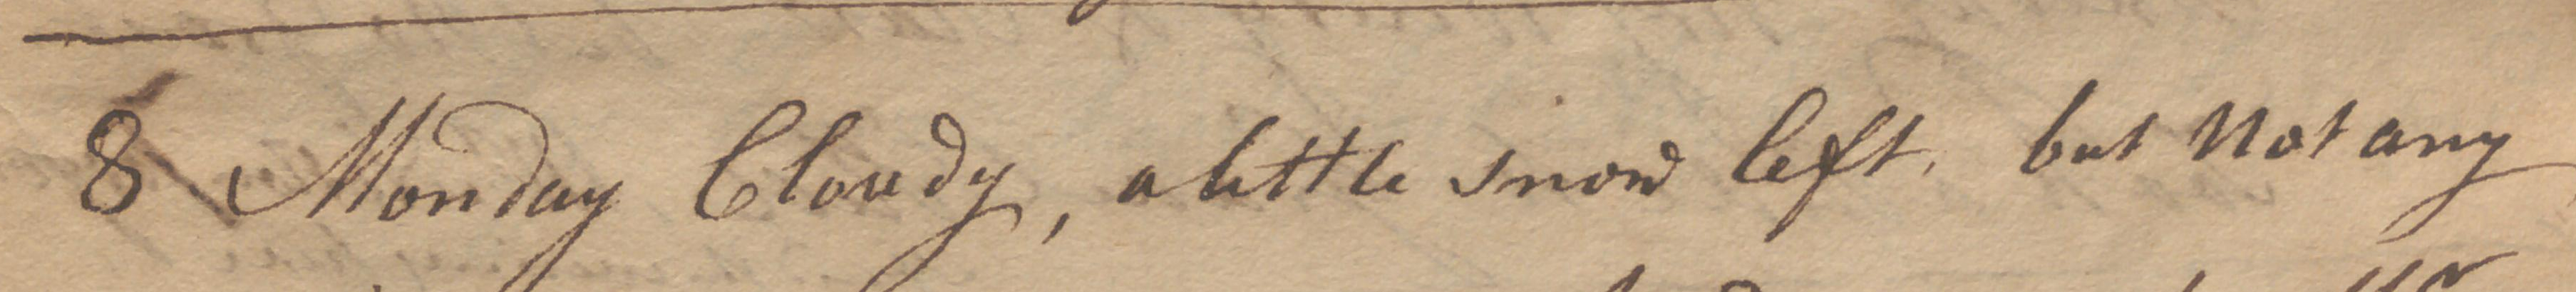8 Monday Cloudy, a little snow left but not any
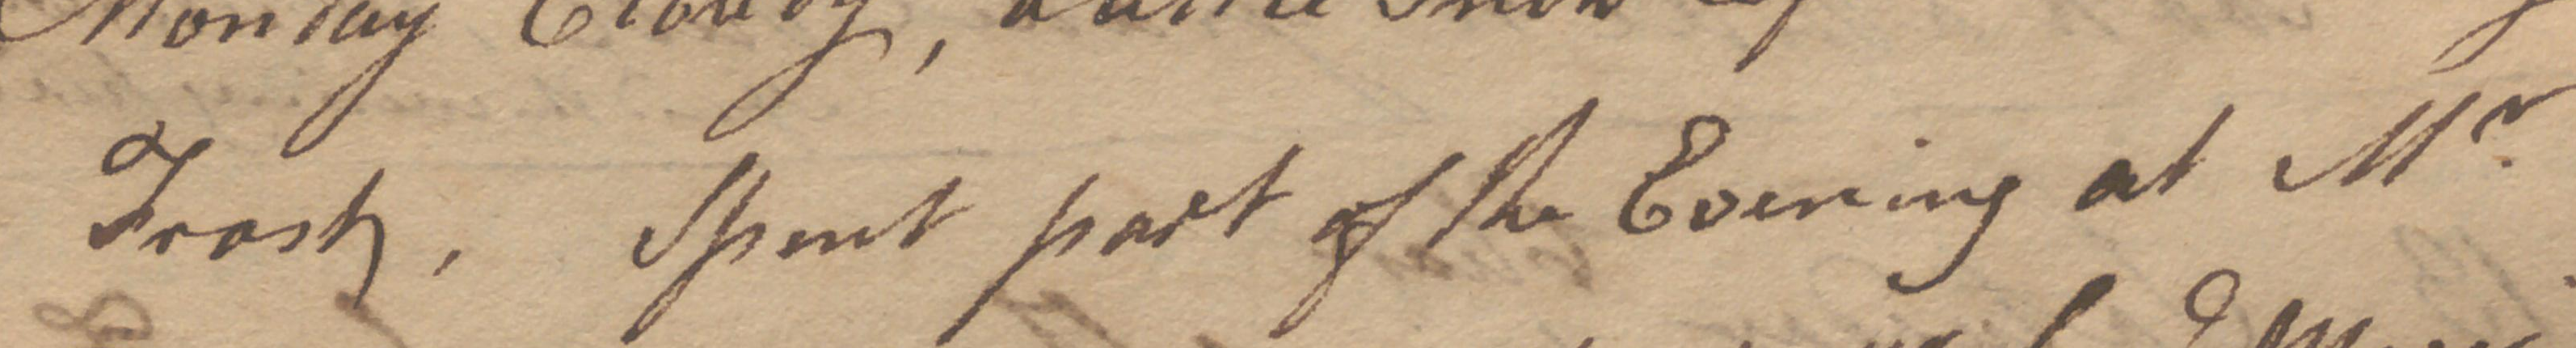Frost. Spent part of the Evening at M^r.
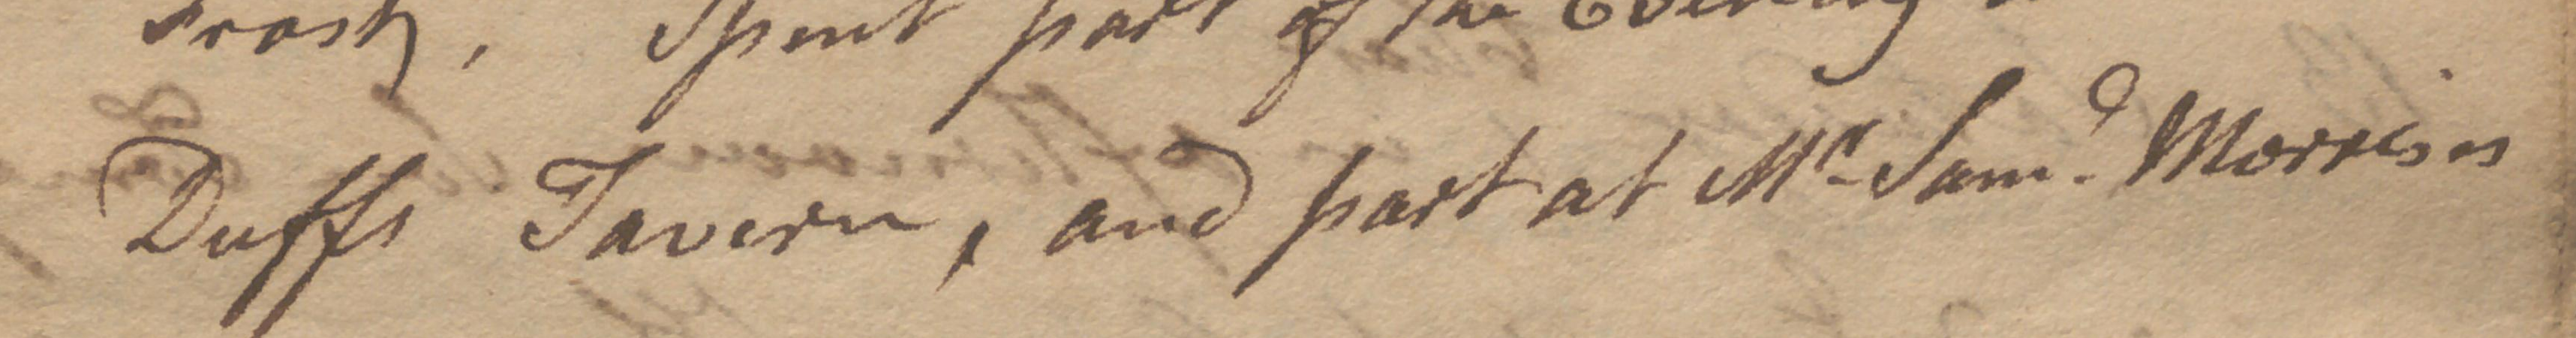Duffs Tavern, and part at M^r. Sam^l. Morrrises
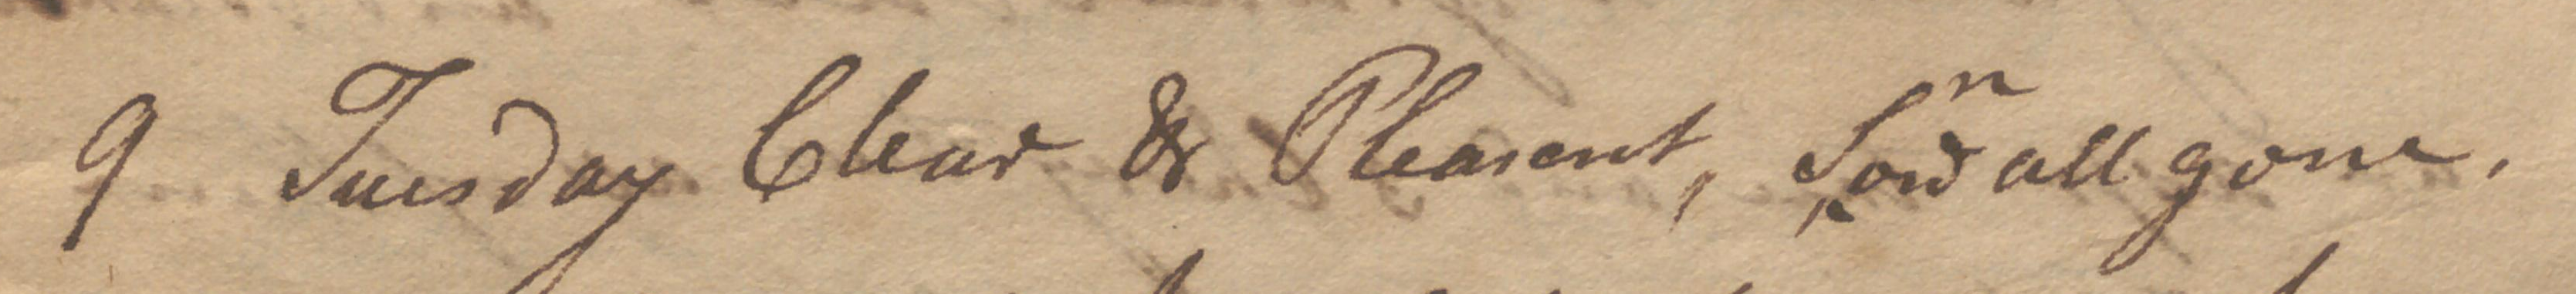9 Tuesday Clear & Pleasent, S^now all gone,
